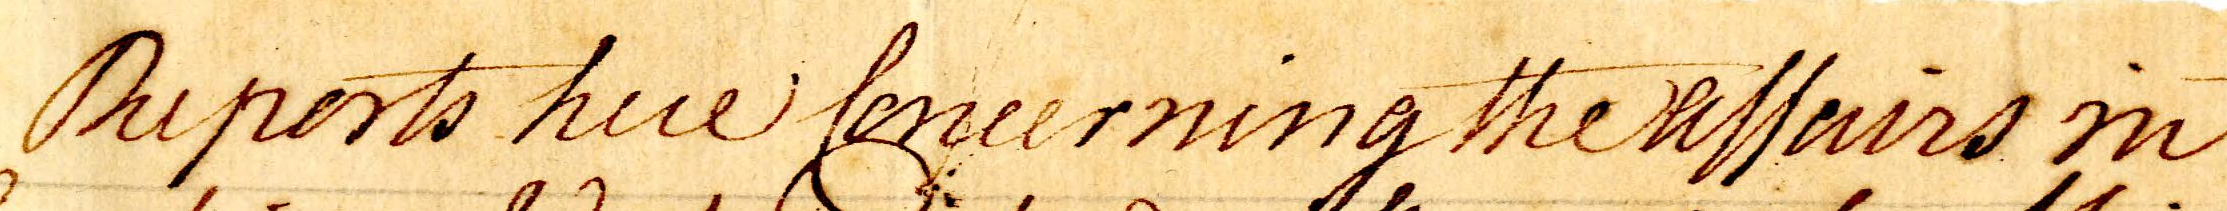Reports here Concerning the Affairs in
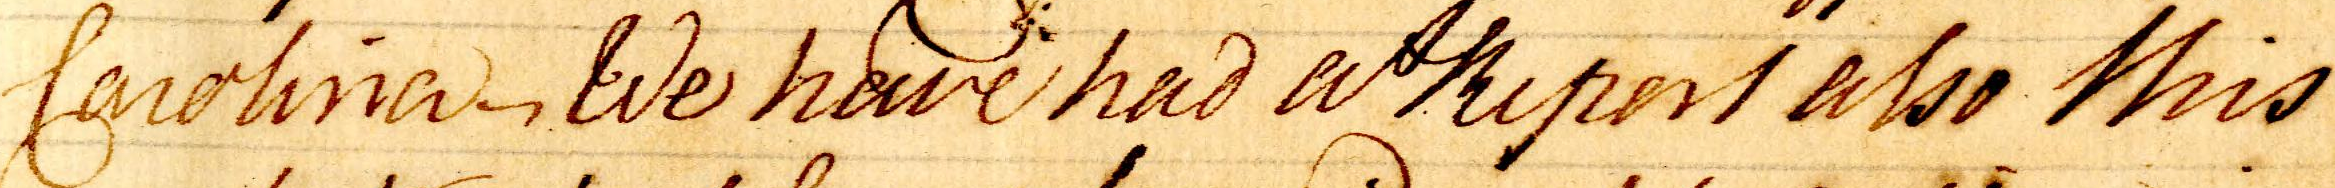Carolina We have had a Report also this
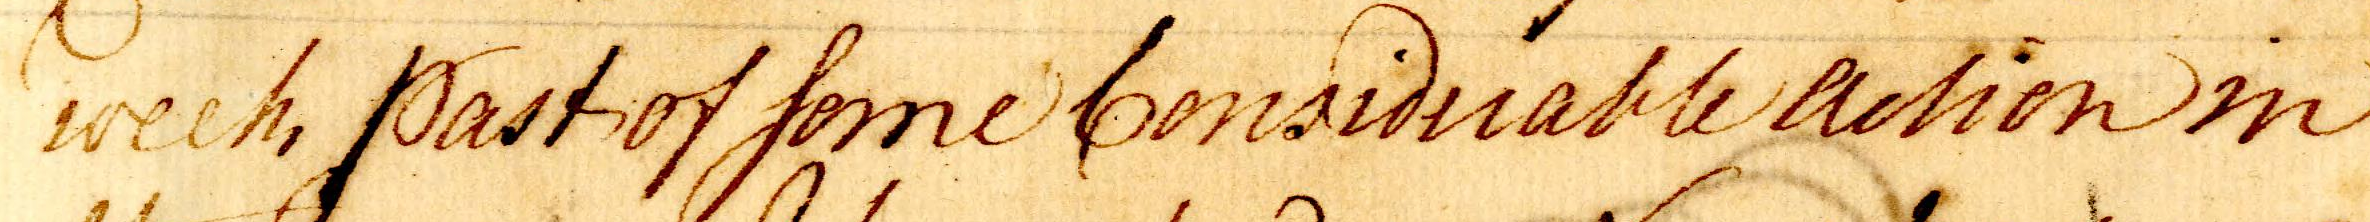week past of some Considerable Action in
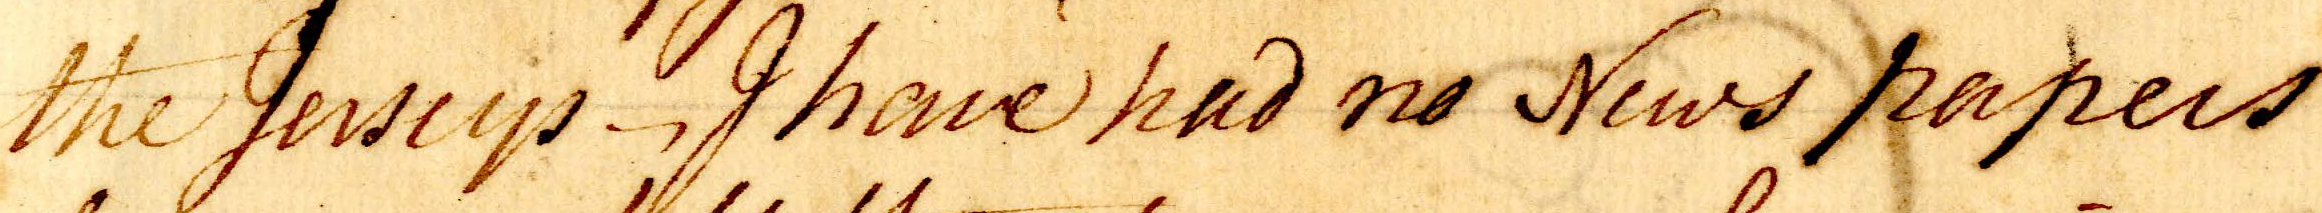the Jerseys- I have had no News papers
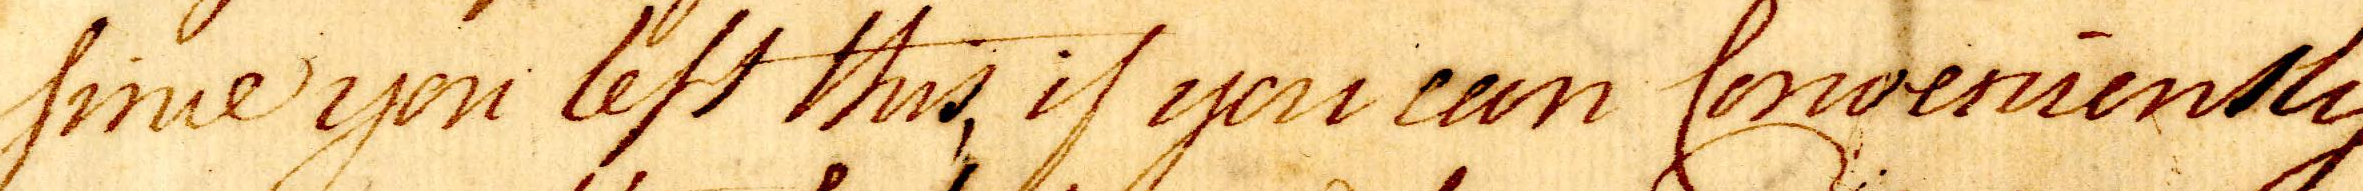since you left this, if you can Conveniently
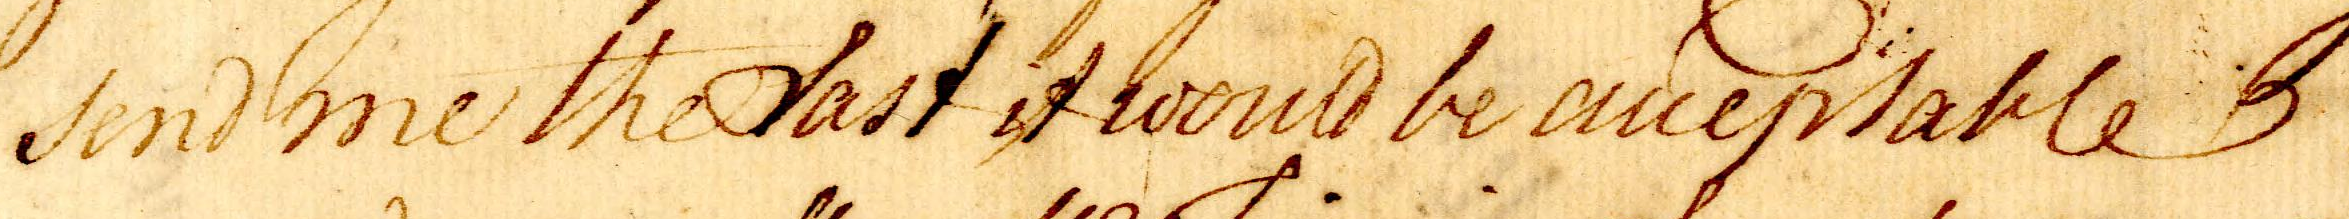send me the Last it would be acceptable.
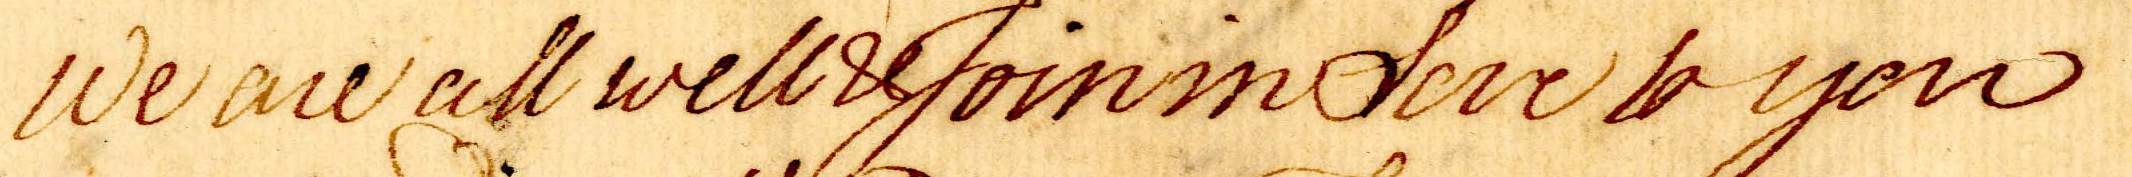we are all well & Join in Love to you
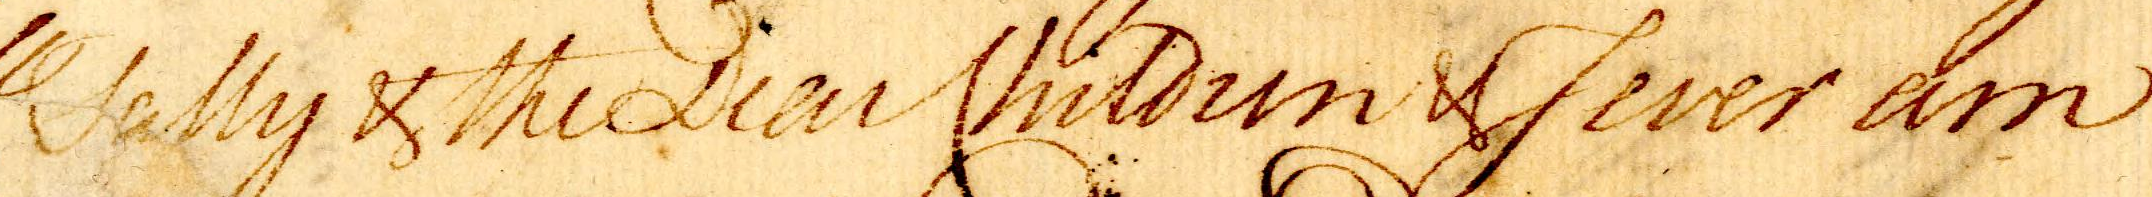Sally & the Dear Children & I ever am
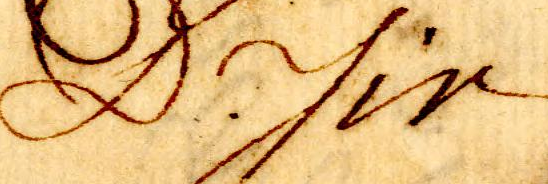D^r. Sir
